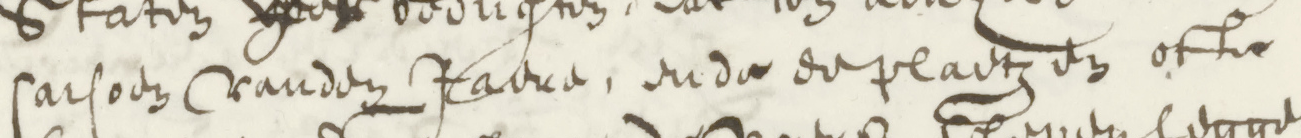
saisoen vanden jaere, ende de plaetzen ofte
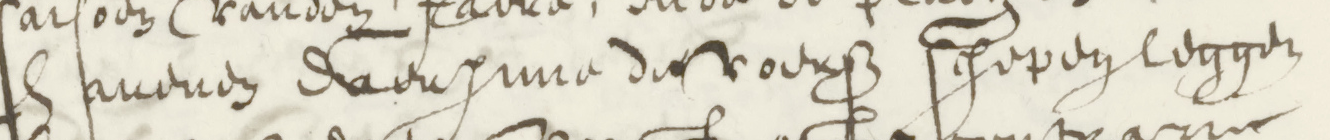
havenen daerinne de voers schepen leggen
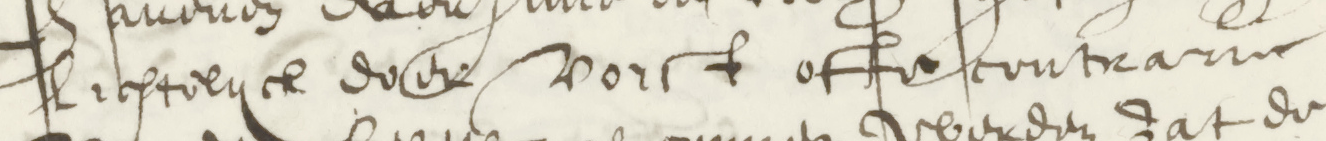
lichtelijck doer vorst ofte contrarie
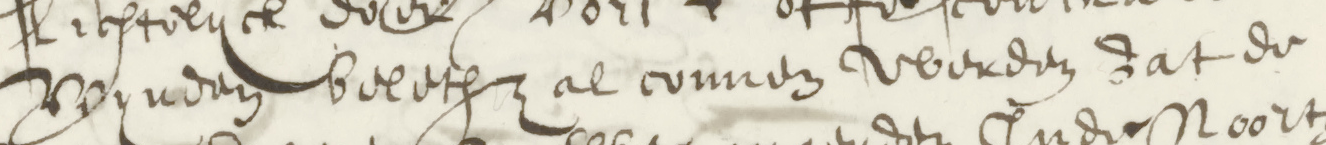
wynden beleth zal connen werden dat de
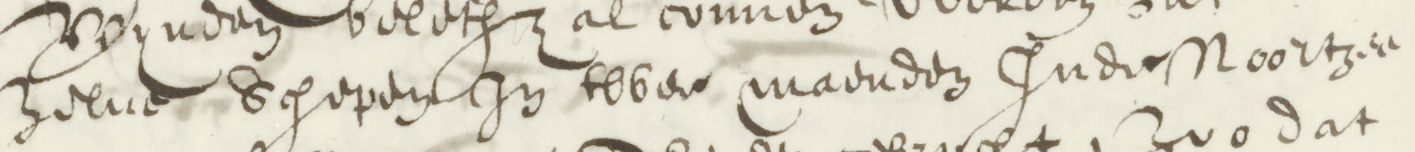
zelve schepen in twee maenden inde Noortzee
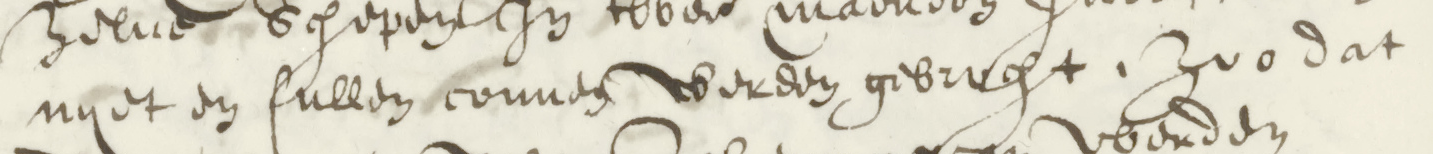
nyet en sullen connen werden gebrecht, zoo dat
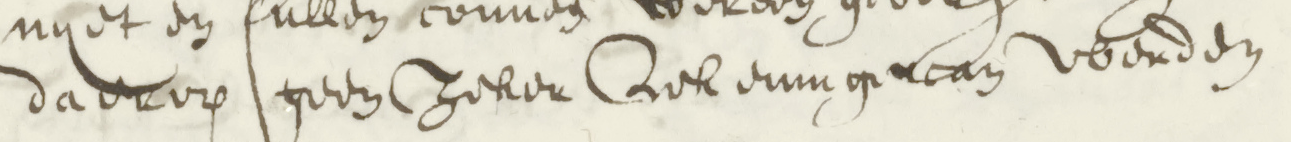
daerop geen zeker rekeninge can werden
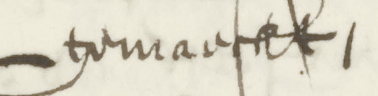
gemaeckt.
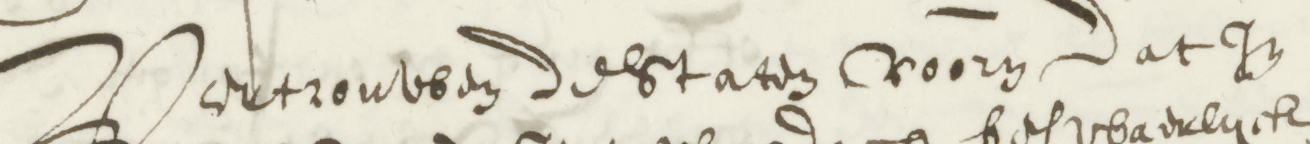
Vetrouwen de Staten voorn dat in
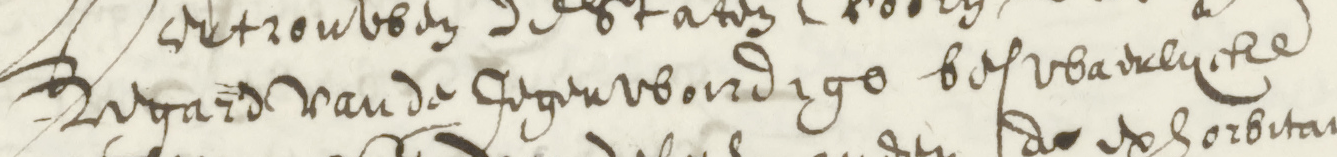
regard van de jegenwoirdige beswaerlycke
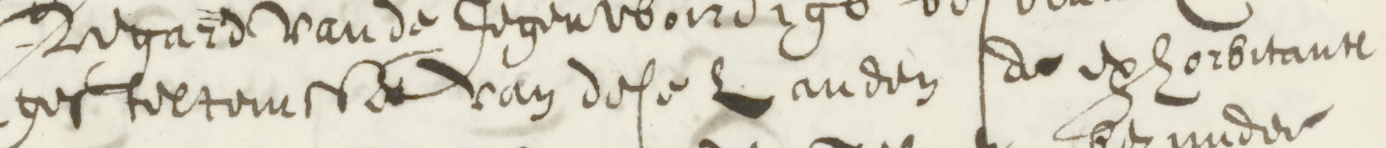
gesteltenisse van dese Landen de exhorbitante
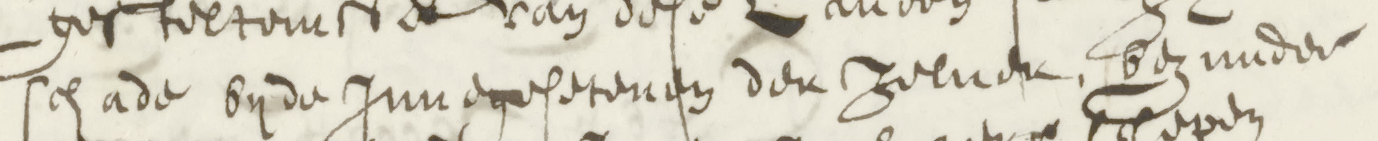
schade bijde innegesetenen der zeluer bezunder
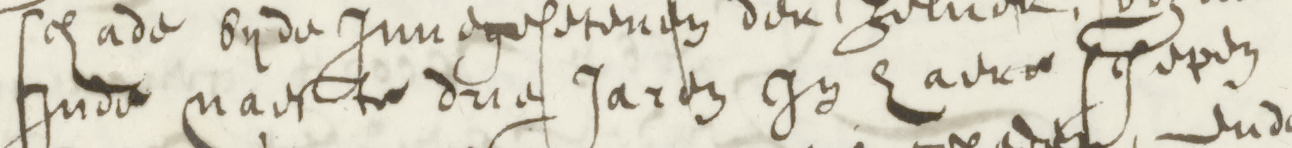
inde naeste drie jaren in haere schepen
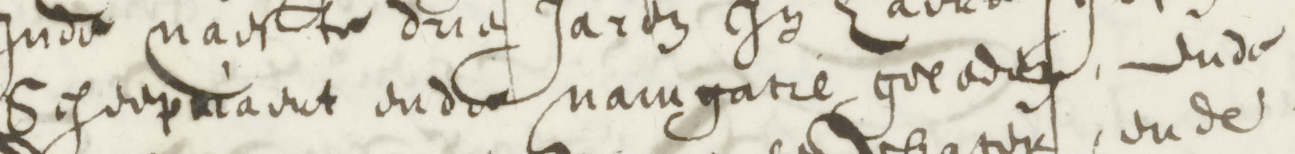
scheepvaert ende nauigatie geleden, ende
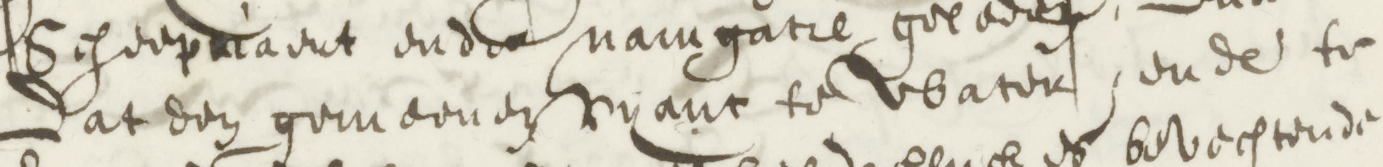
dat den gemeenen vyant te water, ende te
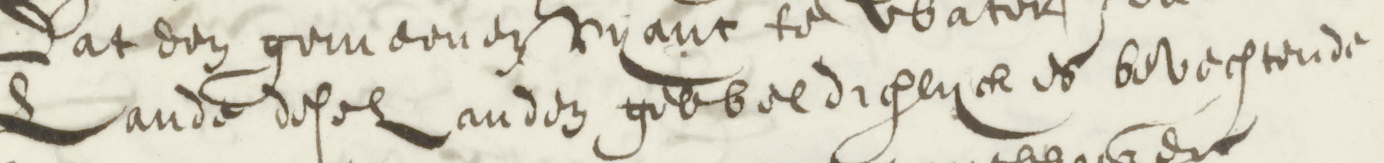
Lande dese Landen geweldiglyck es bevechtende
